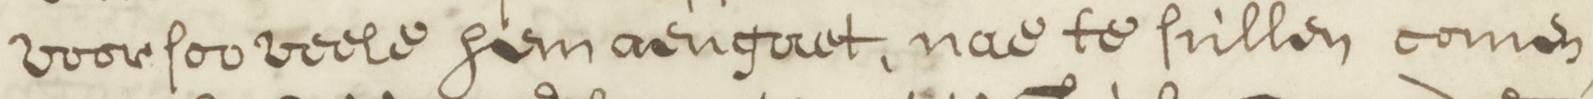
voor soo veele hem aengaet, nae te sullen comen
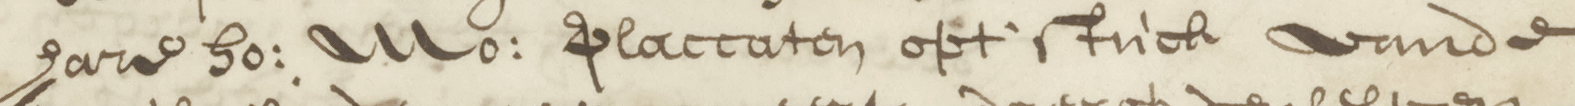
hare ho:Mo: placcaten opt' stuck vande
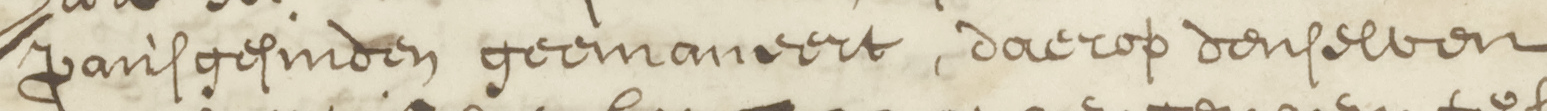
pausgesinden geemaneert, daerop denselven
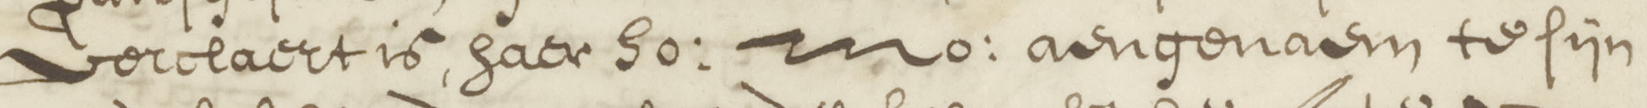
verclaert is, haer ho:Mo: aengenaem te sijn
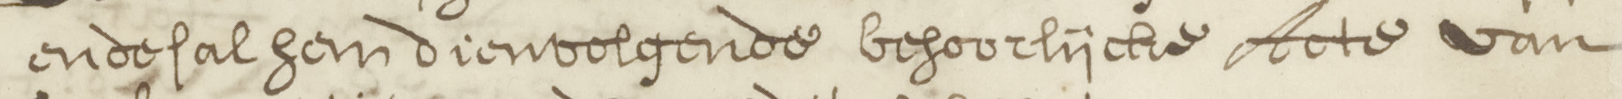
ende sal hem dienvolgende behoorlijcke Acte van
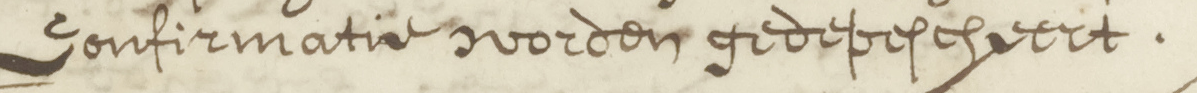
Confirmatie worden gedepescheert.
